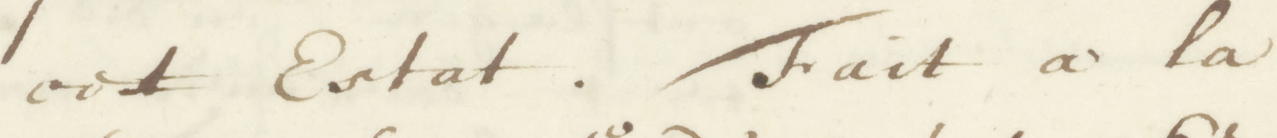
cet Estat. Fait a la
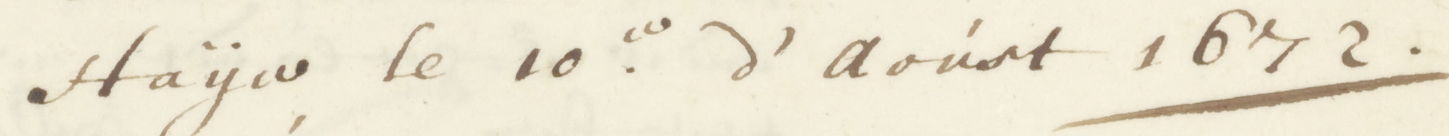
Haije le 10e. d'Aoust 1672.
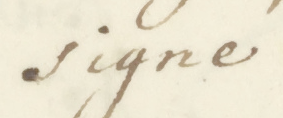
signé
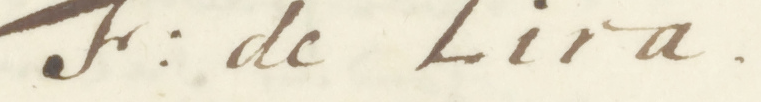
F: de Lira.
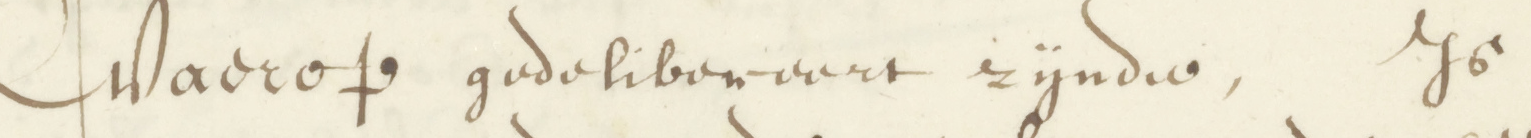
Waerop gedelibereert zijnde, Is
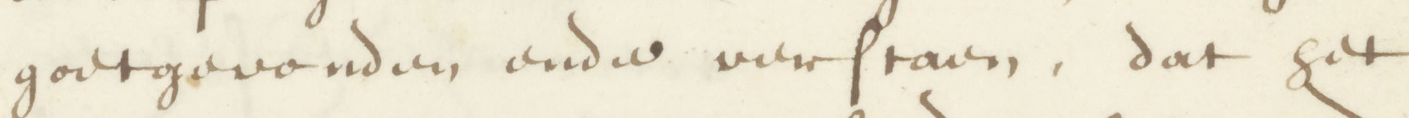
goetgevonden ende verstaen, dat het
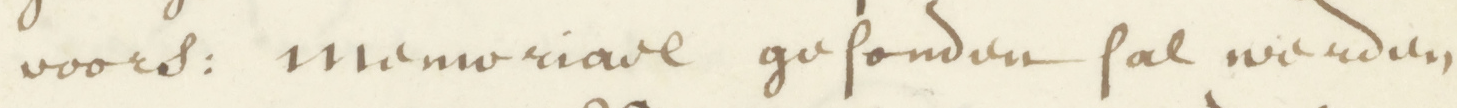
voors: Memoriael gesonden sal werden
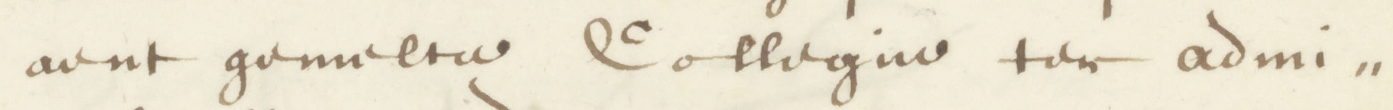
aent gemelte Collegie ter admi„
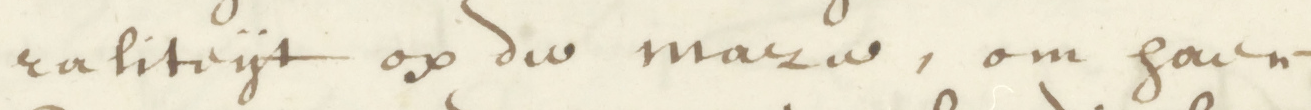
raliteijt op de Maze, om haer
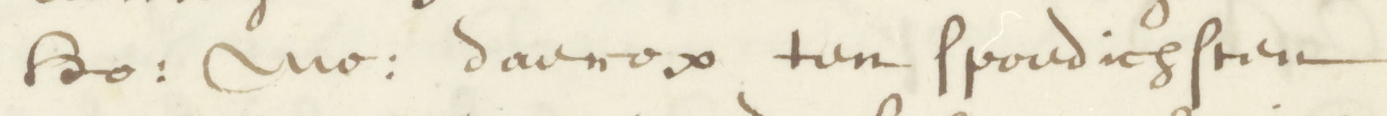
Ho:Mo: daerop ten spoedichsten
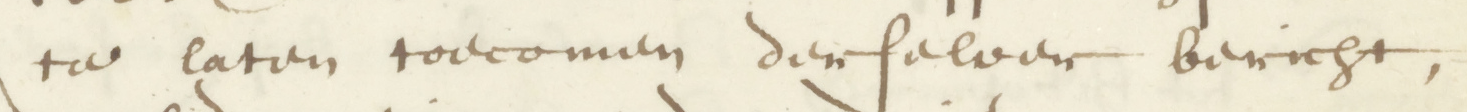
te laten toecomen derselver bericht,
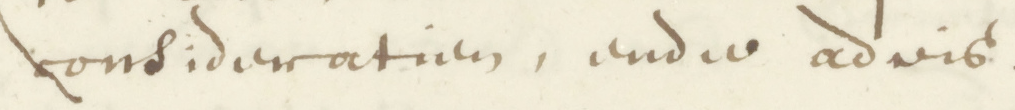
consideratien, ende advis.
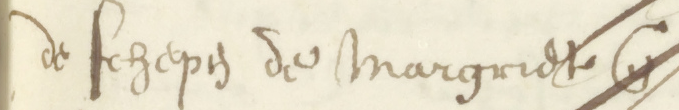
de schepen de Margriet &
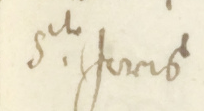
St. Joris
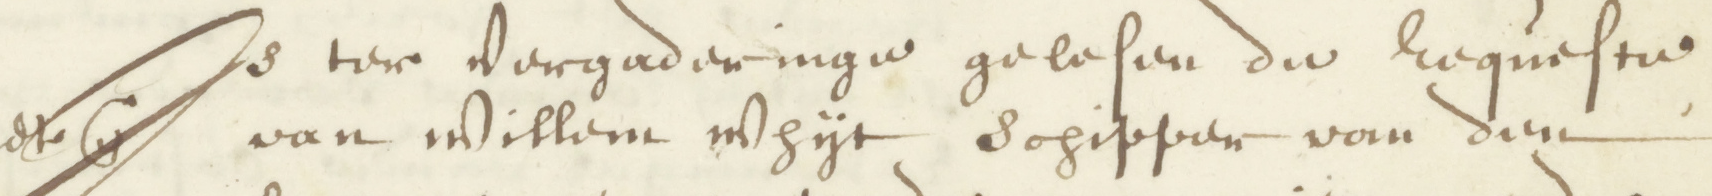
Is ter Vergaderinge gelesen de requeste
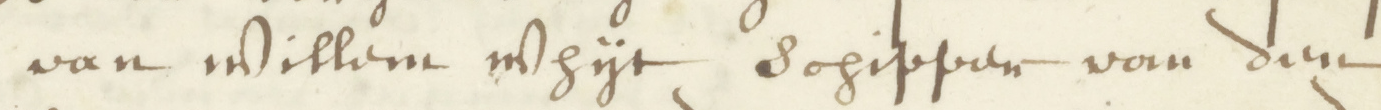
van Willem Whijt Schipper van den
